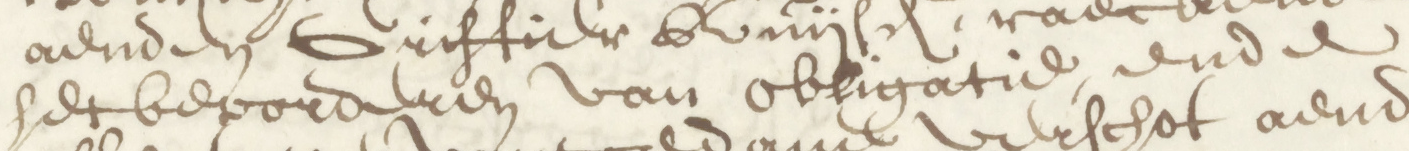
het bevorderen van obligatie, ende
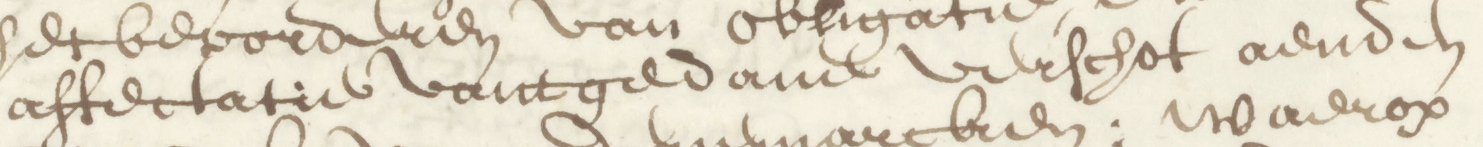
affectatie vant gedane verschot aenden
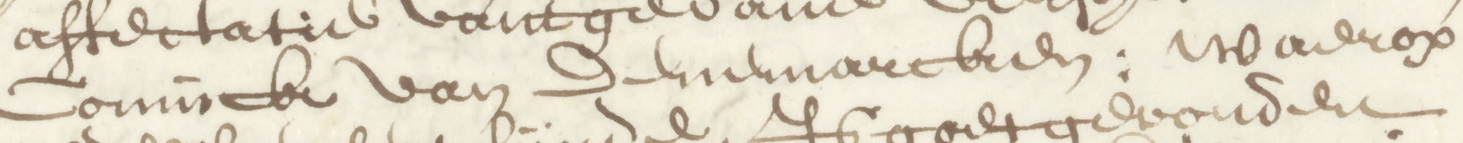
Coninck van Denemarcken: Waerop
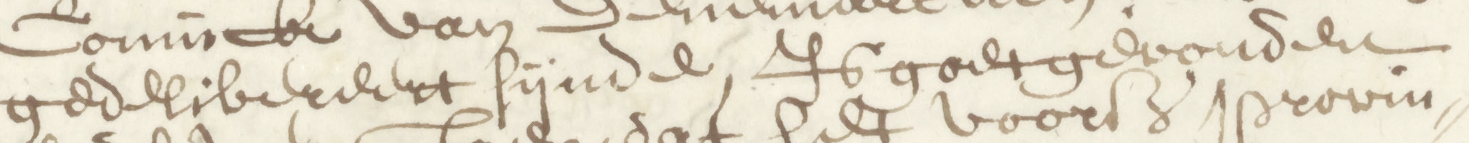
gedelibereert sijnde, Is goetgevonden
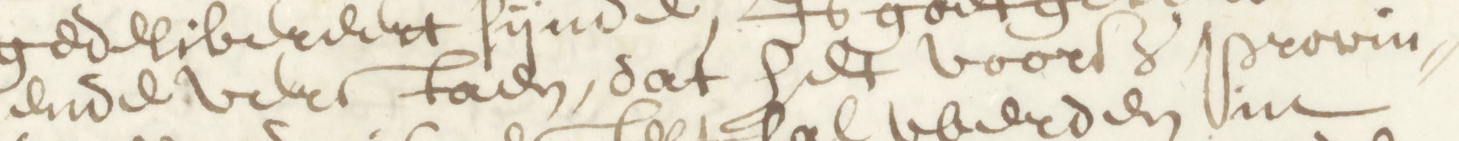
ende verstaen, dat het voors Provin„
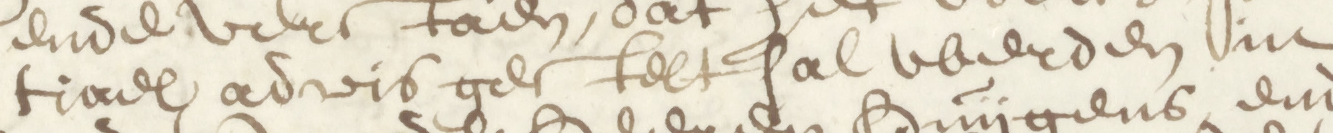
tiael advis gestelt sal werden in
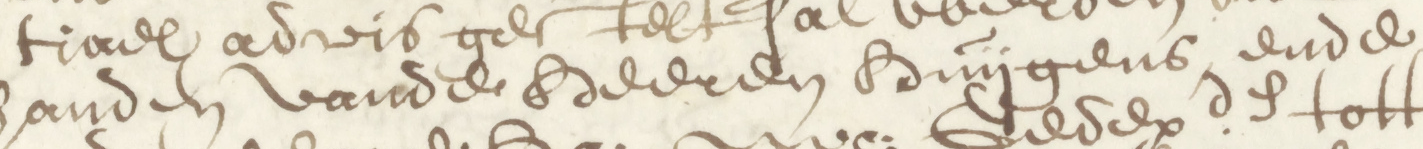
handen vande Heeren Huijgens, ende
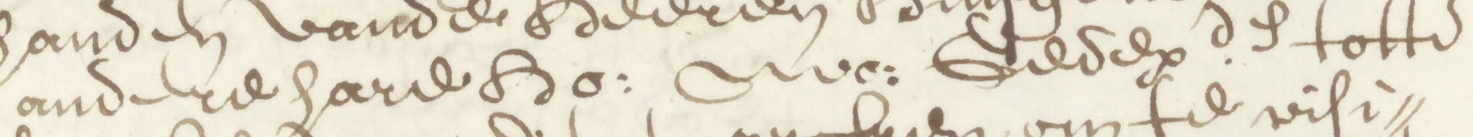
andere hare Ho:Mo: Gedepden . totte
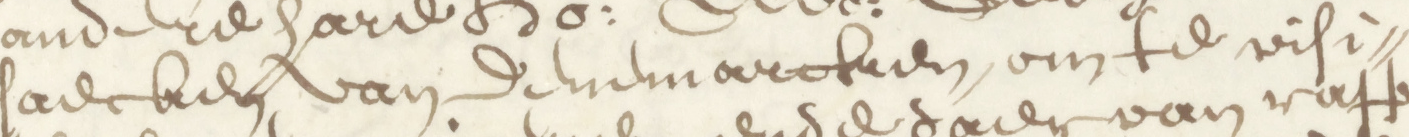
saecken van Denemarcken, om te visi„
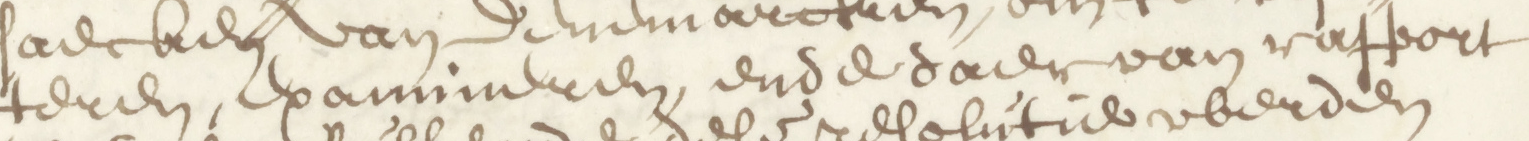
teren, examineren, ende daer van rapport
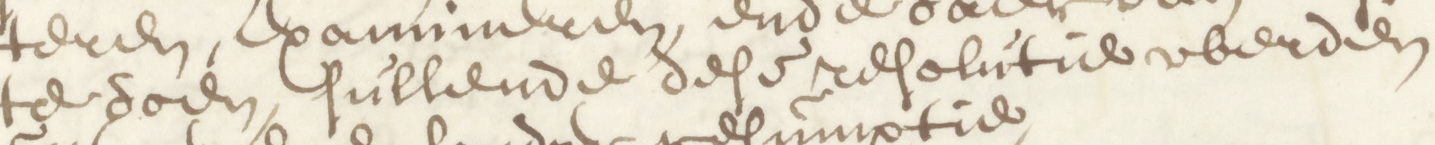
te doen, sullende dese resolutie werden
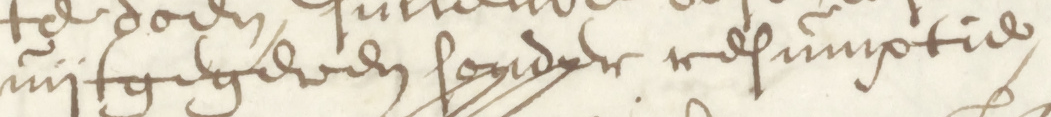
uijtgegeven sonder resumptie.
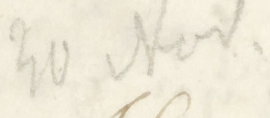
30. Nov.
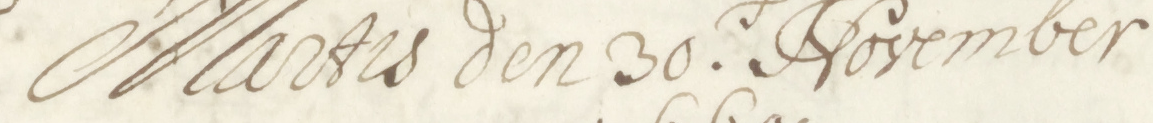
Martis den 30en. November
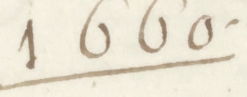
1660.
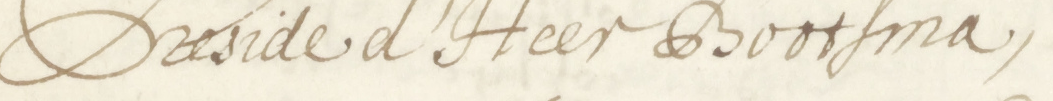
Preside d' Heer Bootsma,
